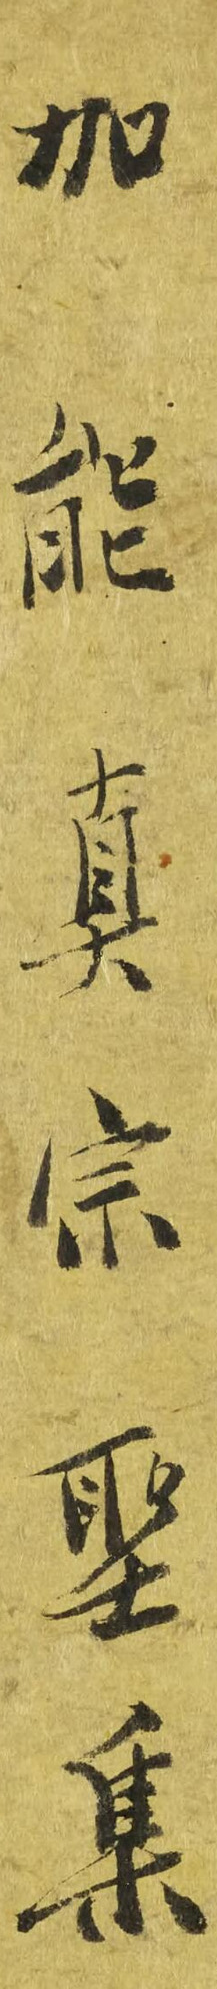加能真宗聖集

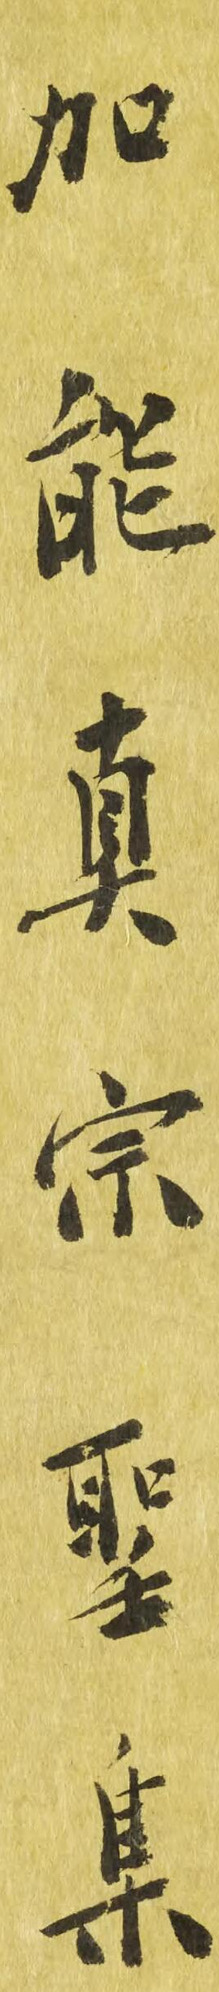加能真宗聖集

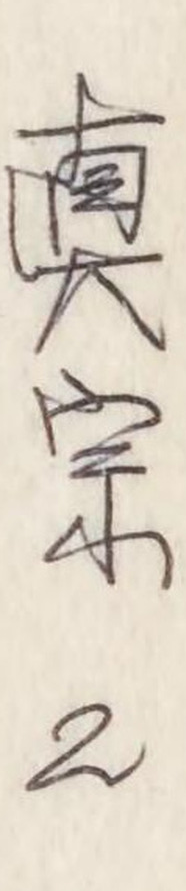真宗２

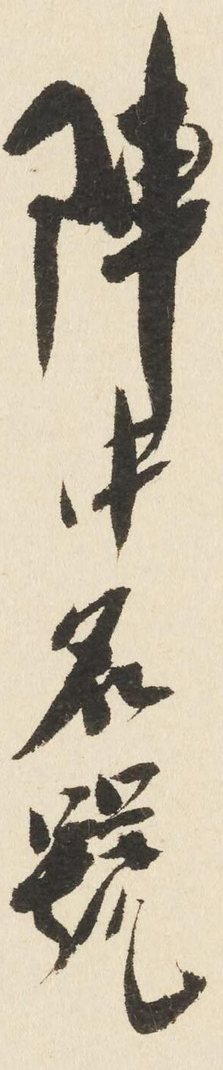陣中名号
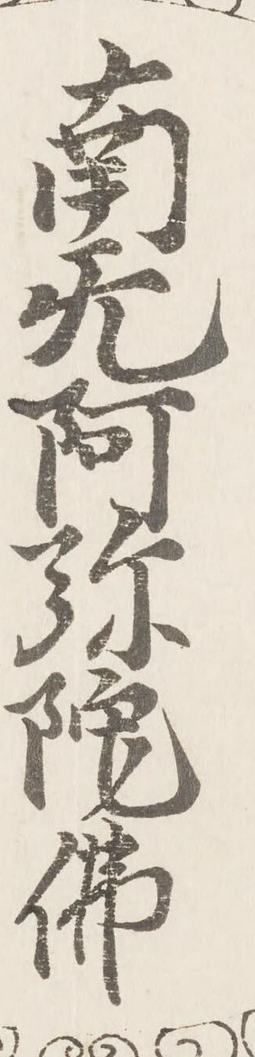南无阿弥陀仏
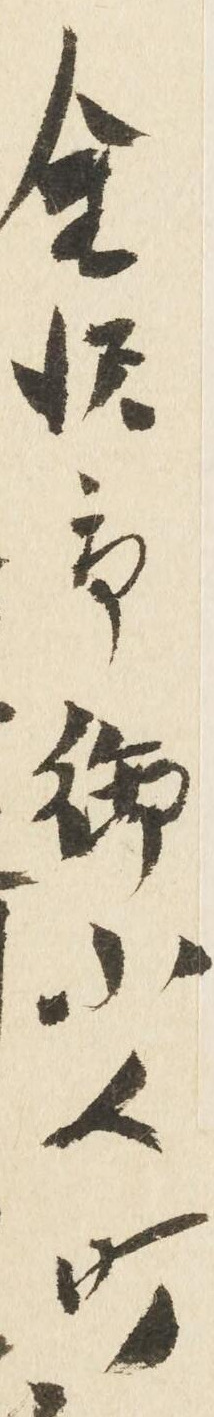金沢市御小人町
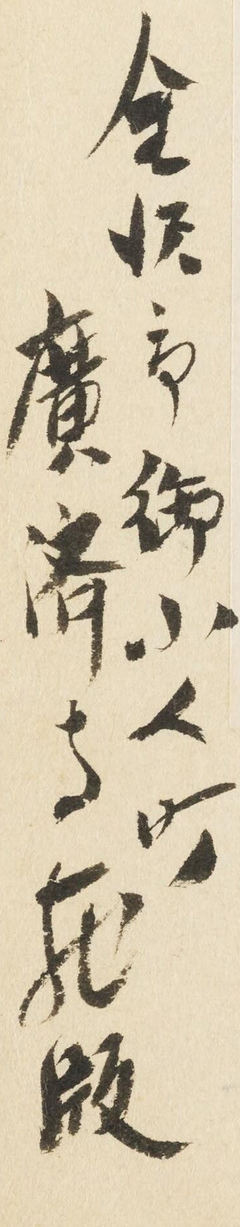広済寺蔵版
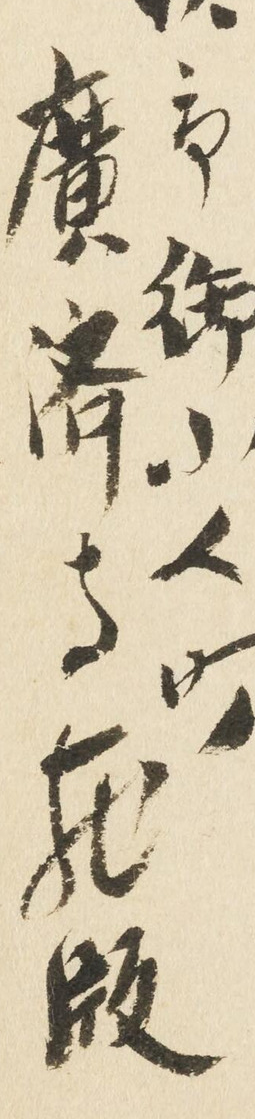広済寺蔵版

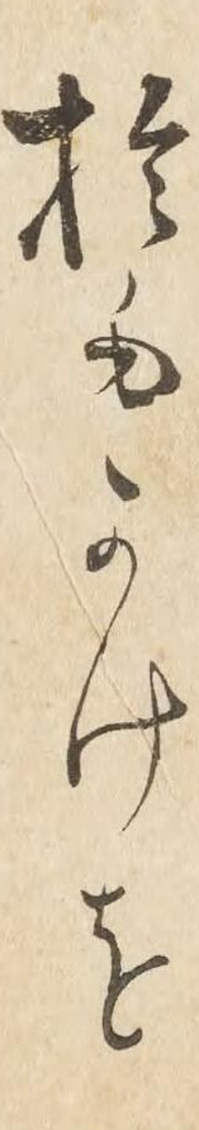おもかけを
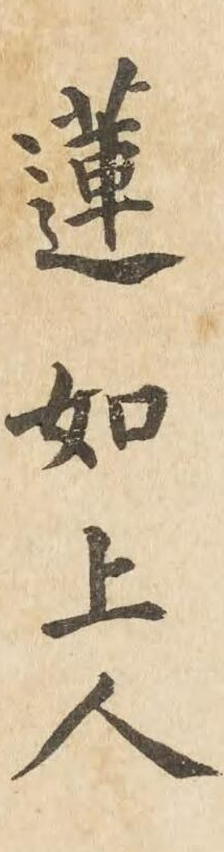蓮如上人
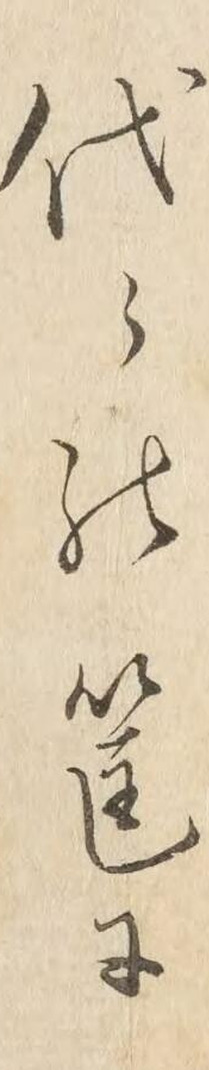代々の筐に
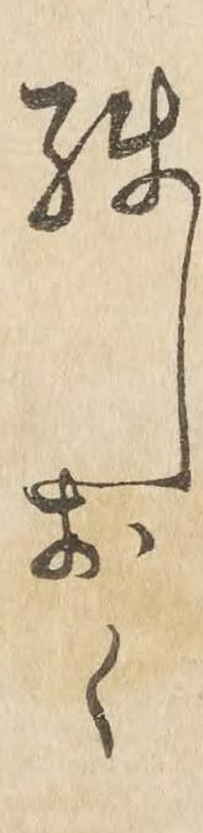残しおく
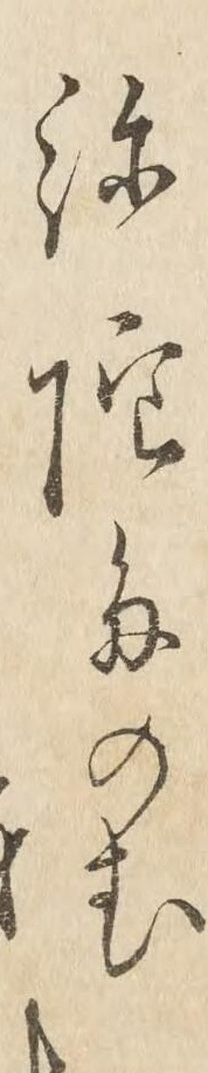弥陀たのむ
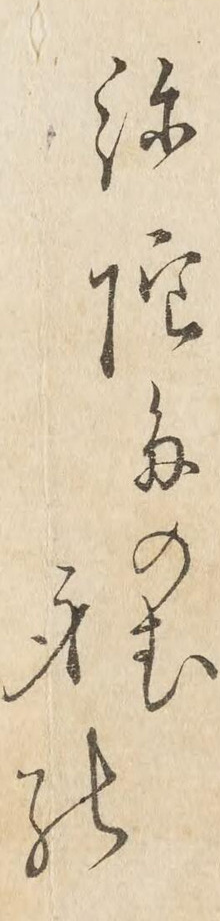弥陀たのむ
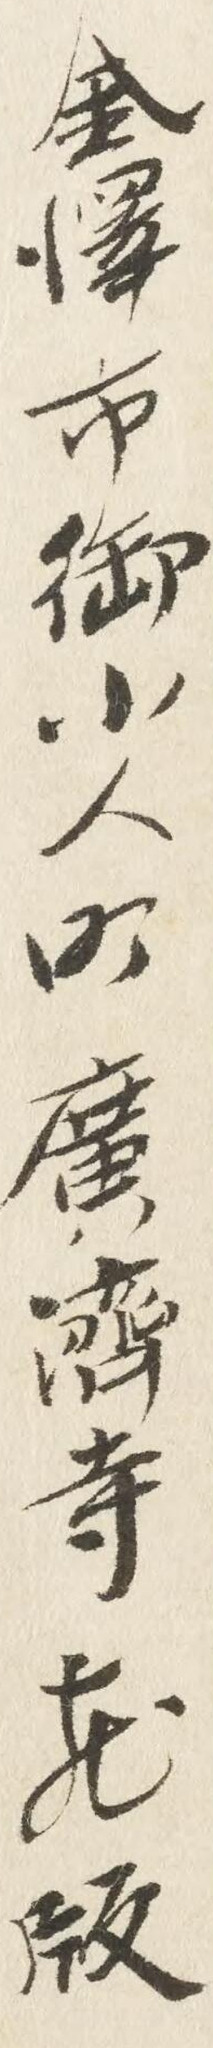金澤市御小人町廣濟寺蔵版

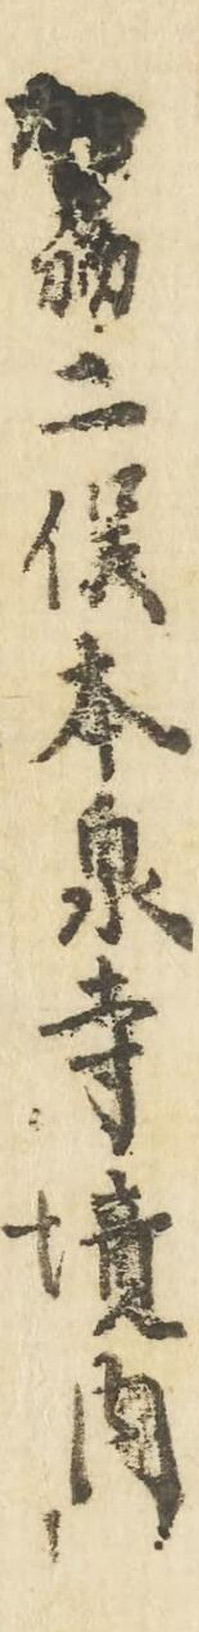加州二俣本泉寺境内
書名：加能真宗聖集
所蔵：Ishikawa Prefectural Library
